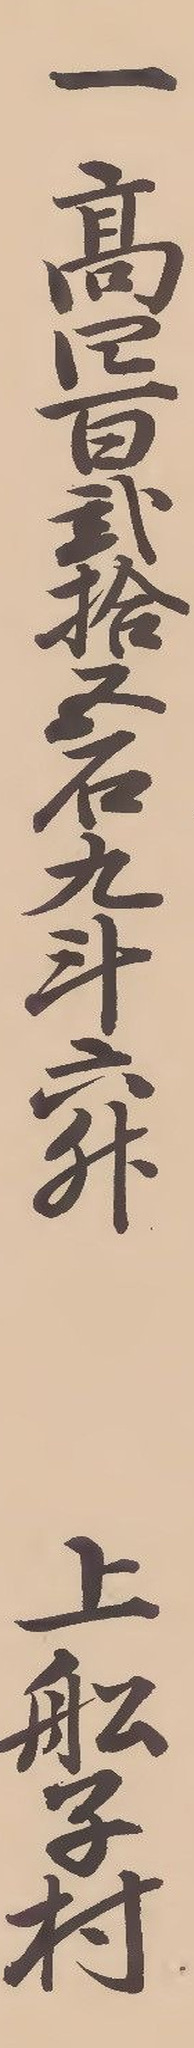一高四百弐拾五石九斗六升上船子村
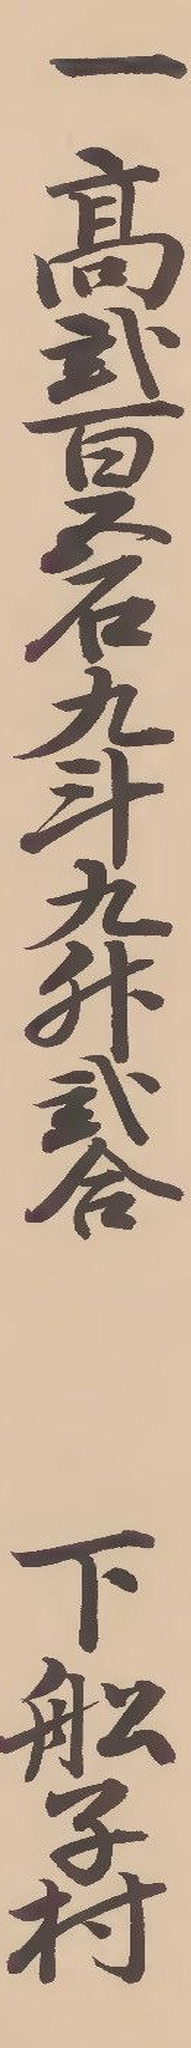一高弐百五石九斗九升弐合下船子村
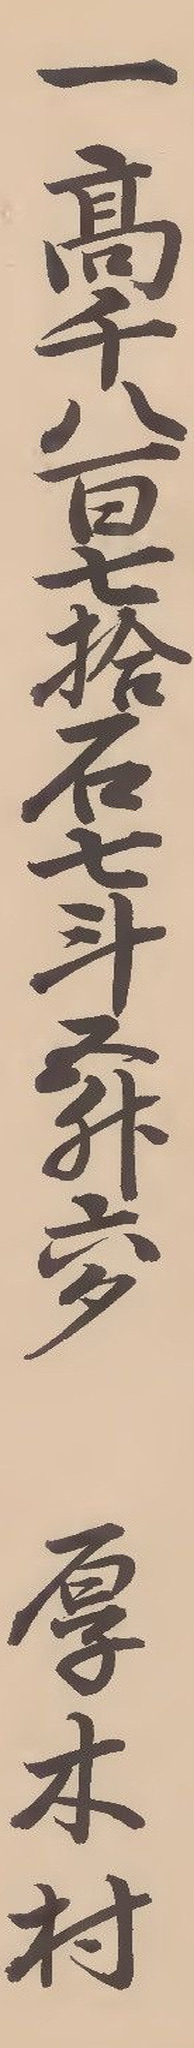一高千八百七拾石七斗五升六勺厚木村
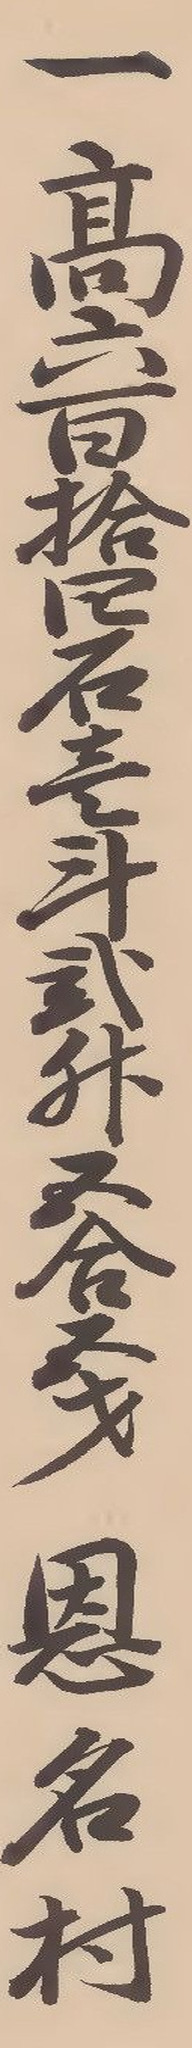一高六百拾四石壱斗弐升五合五才恩名村
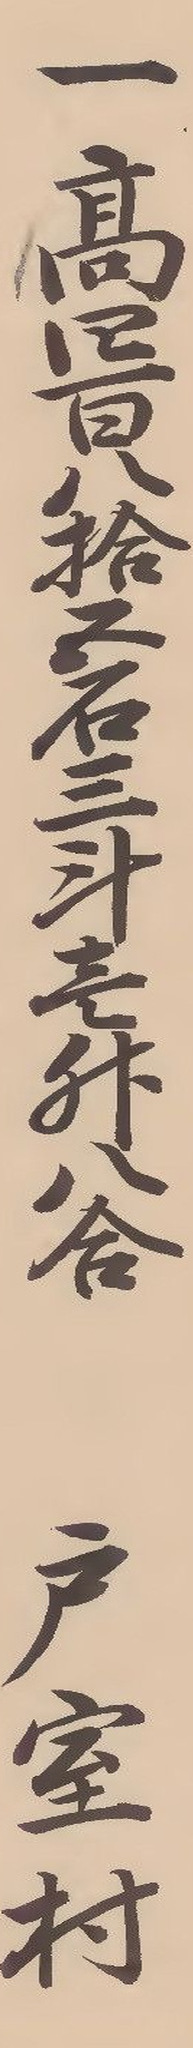一高四百八拾五石三斗壱升八合戸室村
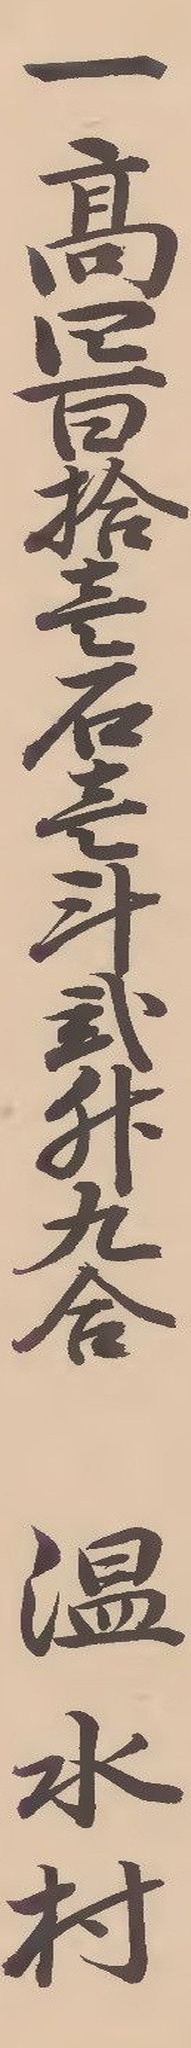一高四百拾壱石壱斗弐升九合温水村

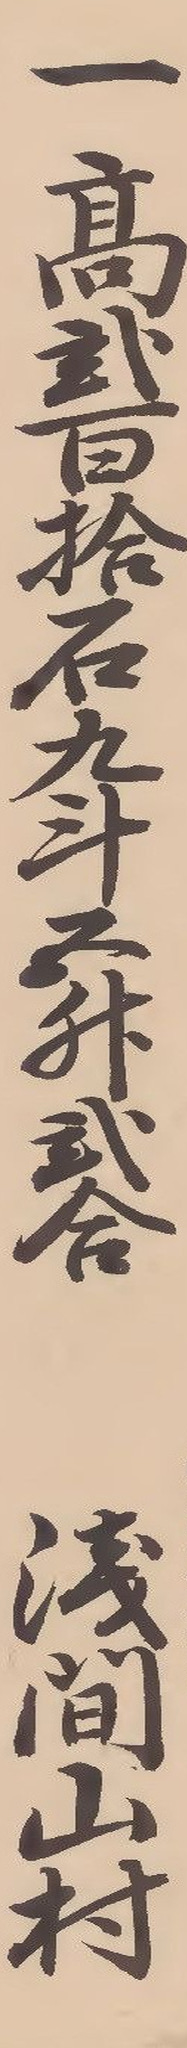一高弐百拾石九斗五升弐合浅間山村
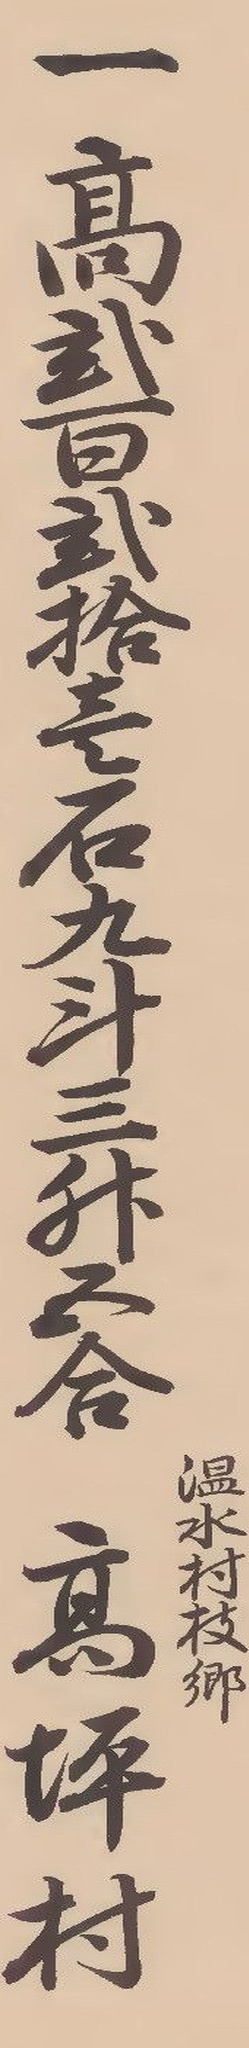一高弐百弐拾壱石九斗三升五合高坪村
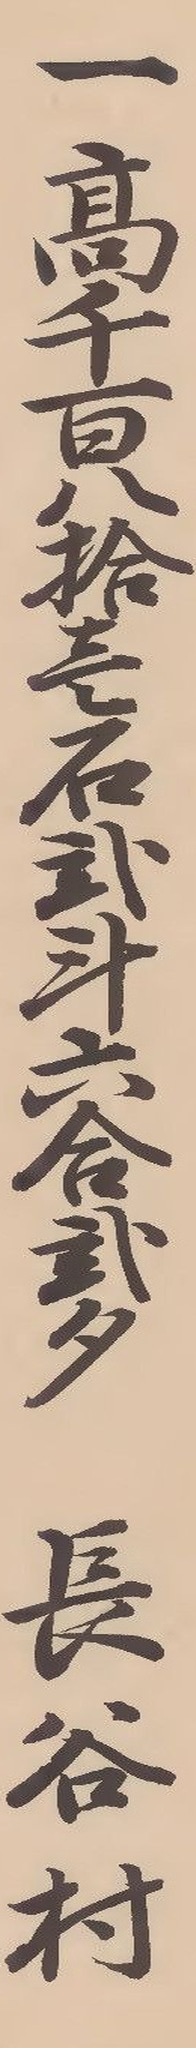一高千百八拾壱石弐斗六合弐勺長谷村
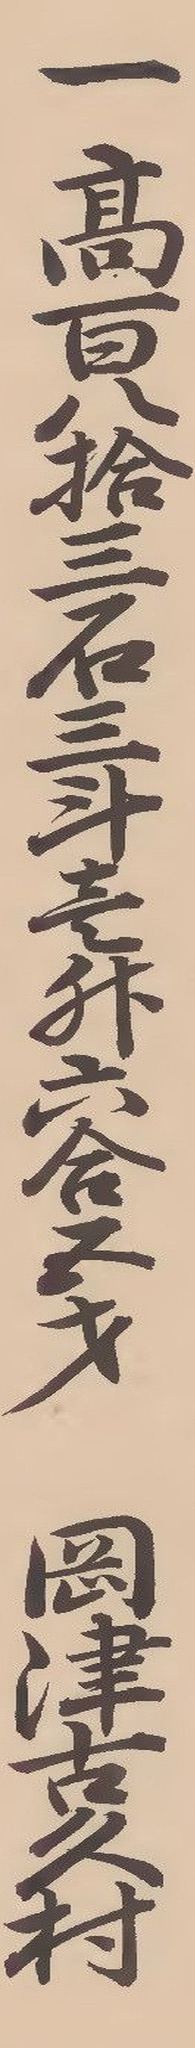一高百八拾三石三斗壱升六合五才岡津古久村
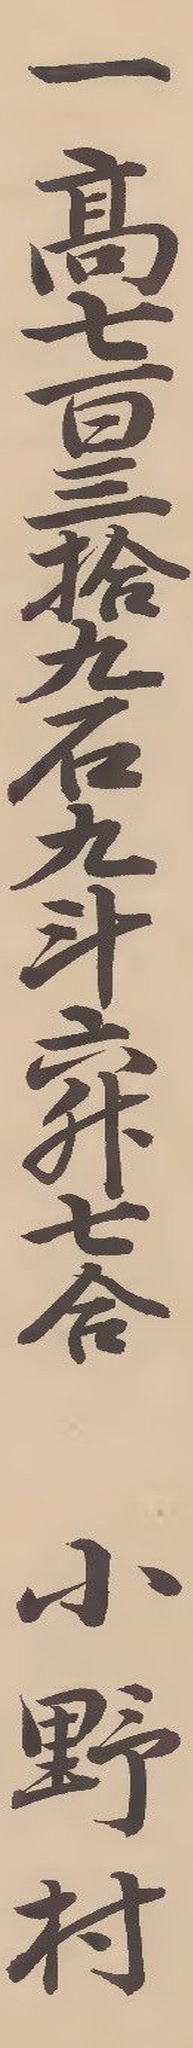一高七百三拾九石九斗六升七合小野村
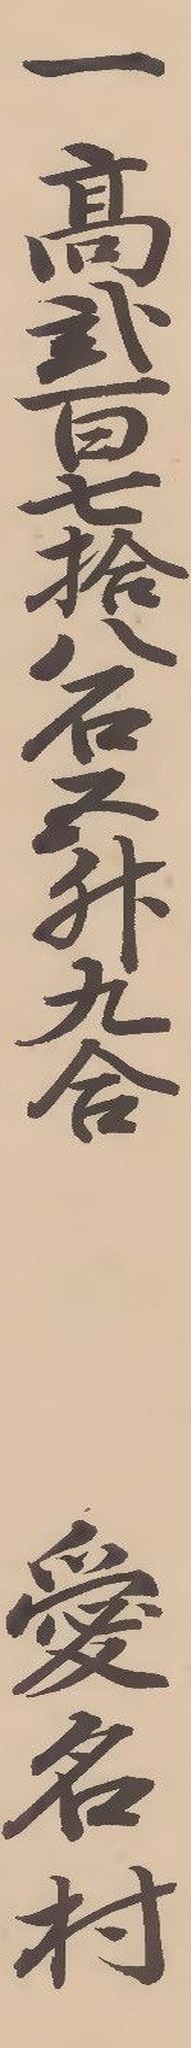一高弐百七拾八石五升九合愛名村
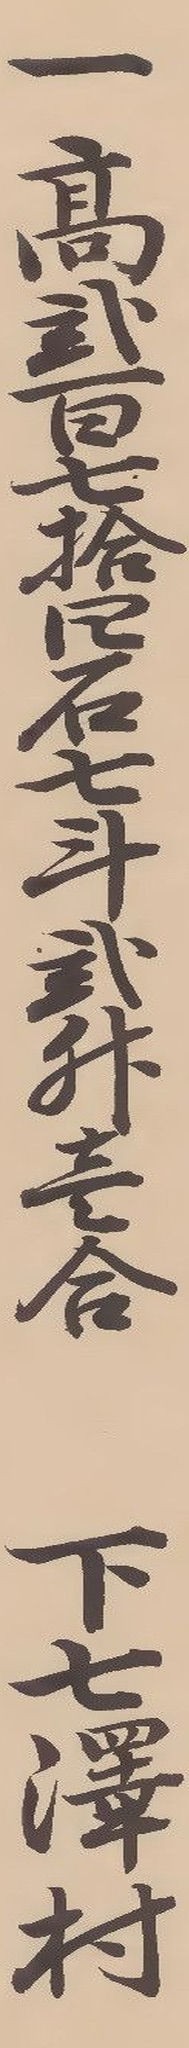一高弐百七拾四石七斗弐升壱合下七澤村
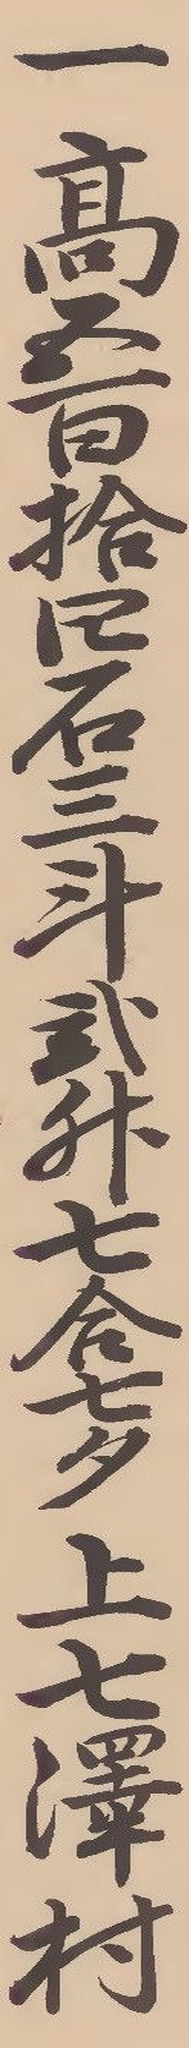一高五百拾四石三斗弐升七合七勺上七澤村

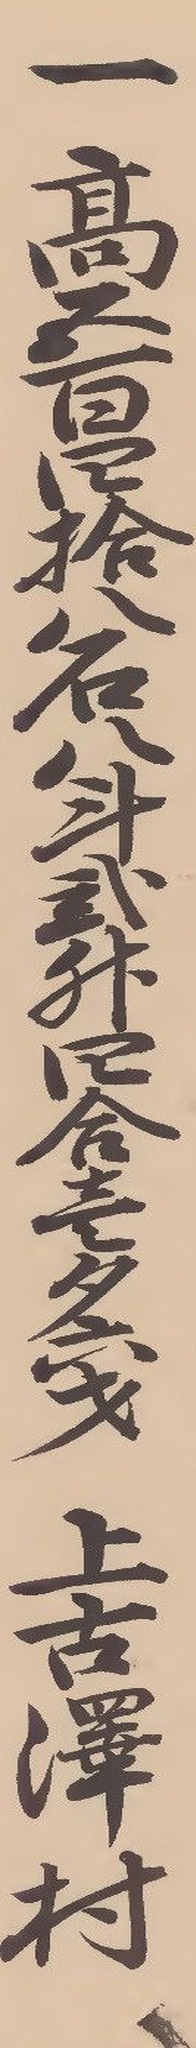一高五百四拾八石八斗弐升四合壱タ六才上古澤村
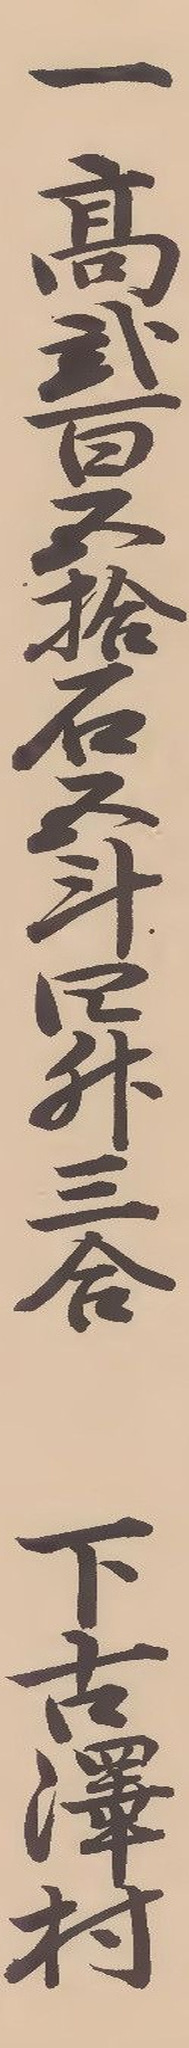一高弐百五拾石五斗四升三合下古澤村
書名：相模国郷帳
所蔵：国立公文書館 National Archives of Japan
